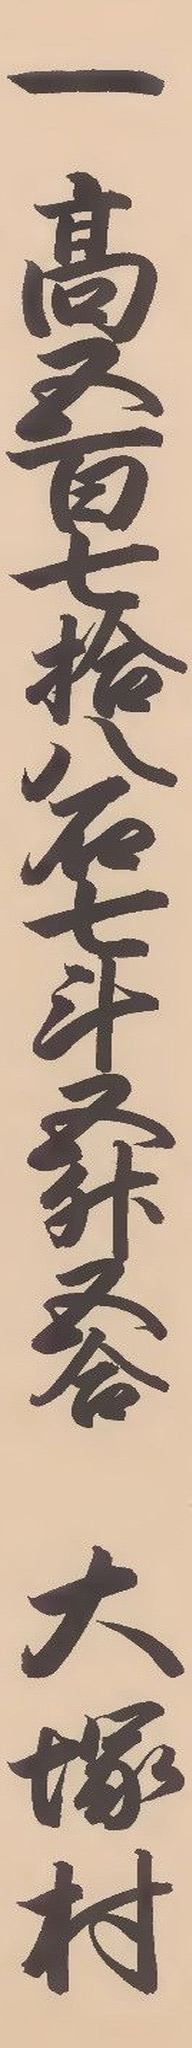一高五百七拾八石七斗五升五合大塚村
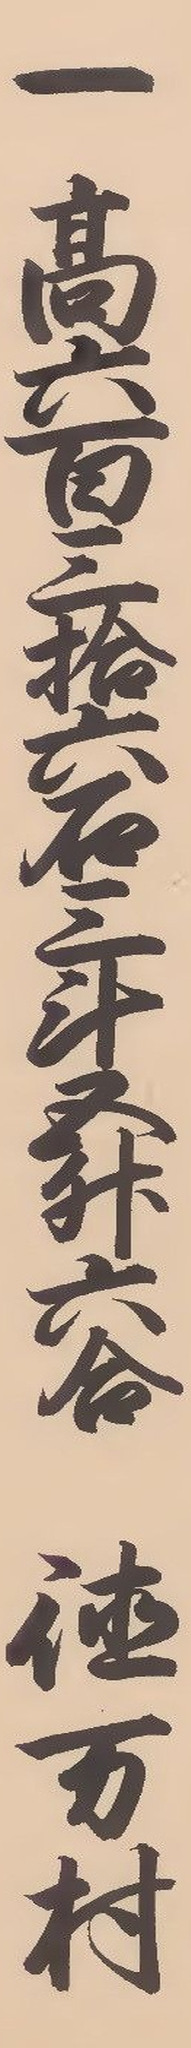一高六百三拾六石三斗五升六合徳万村

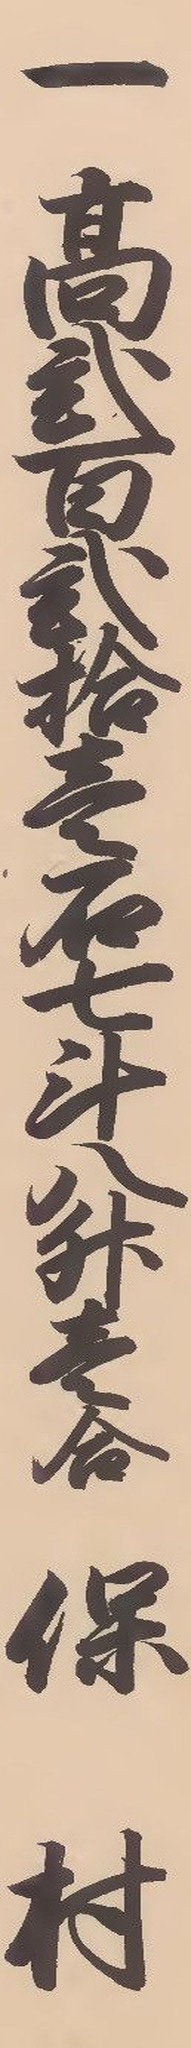一高弐百弐拾壱石七斗八升壱合保村
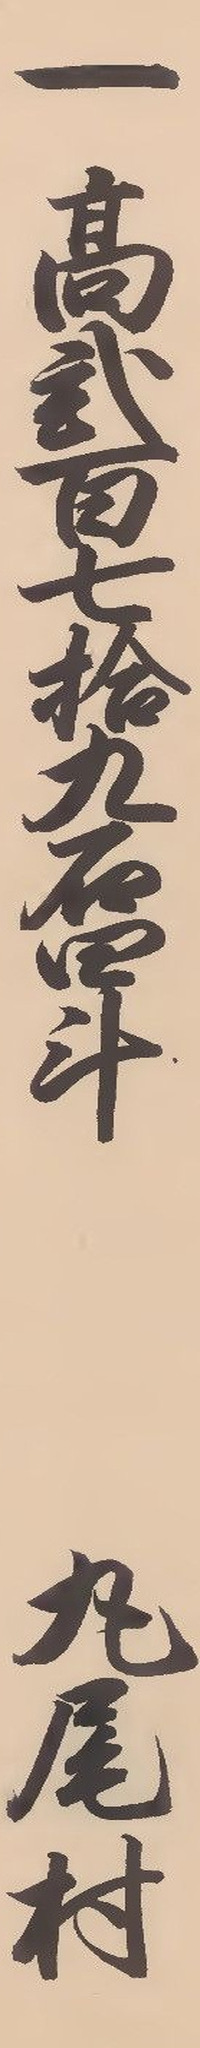一高弐百七拾九石四斗丸尾村
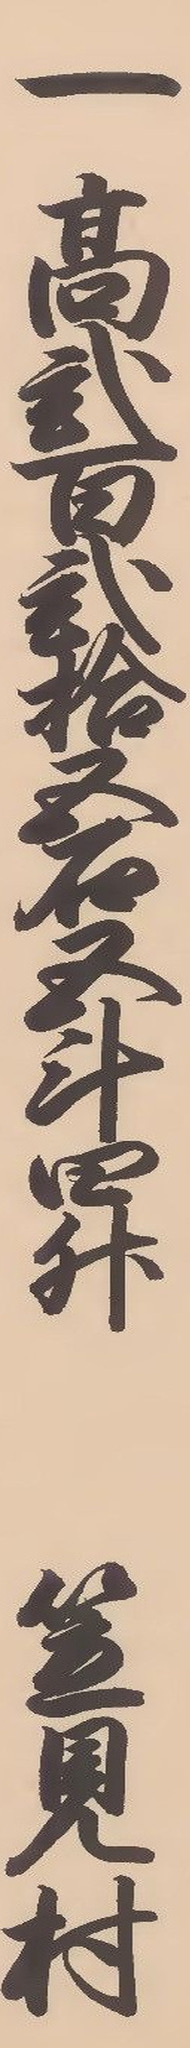一高弐百弐拾五石五斗四升笠見村
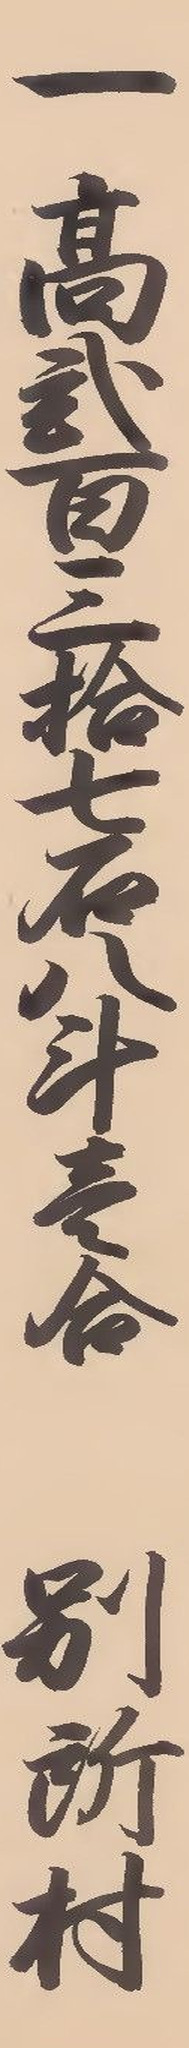一高弐百三拾七石八斗壱合別所村
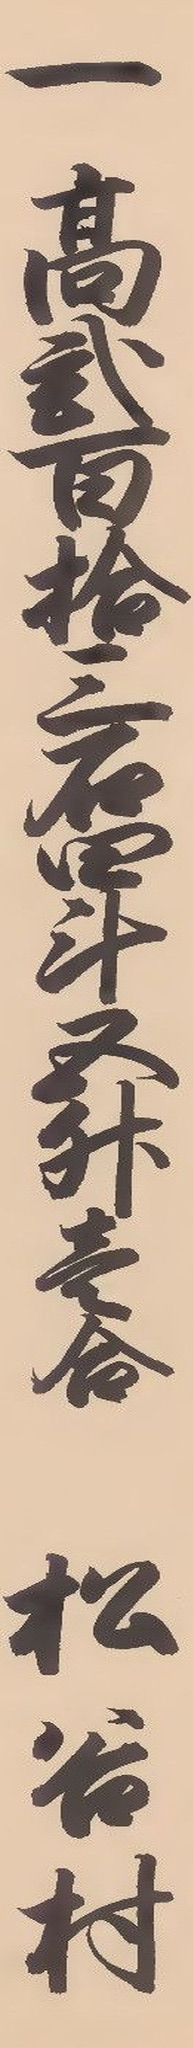一高弐百拾三石四斗五升壱合松谷村
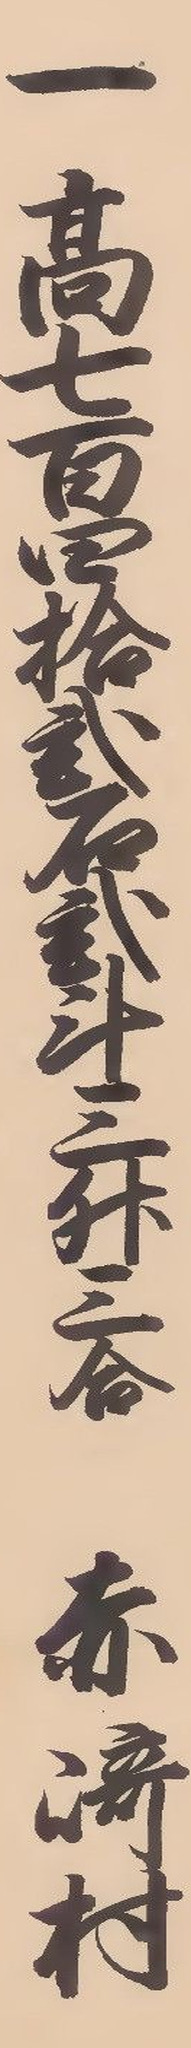一高七百四拾弐石弐斗三升三合赤崎村

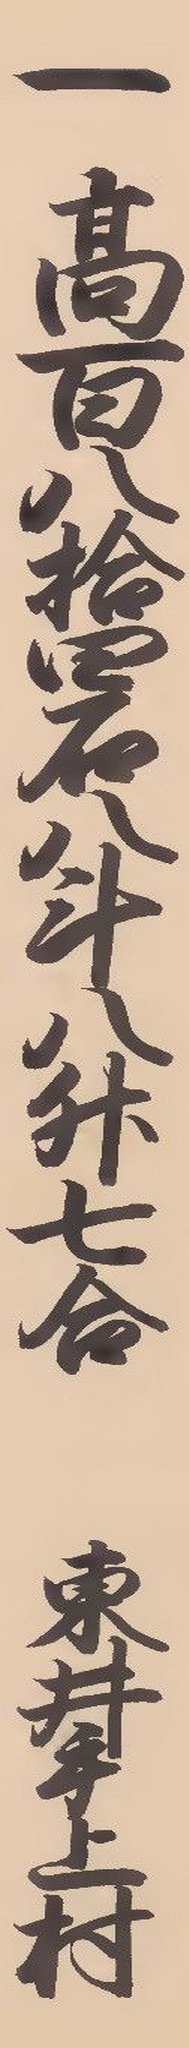一高百八拾四石八斗八升七合東井手上村
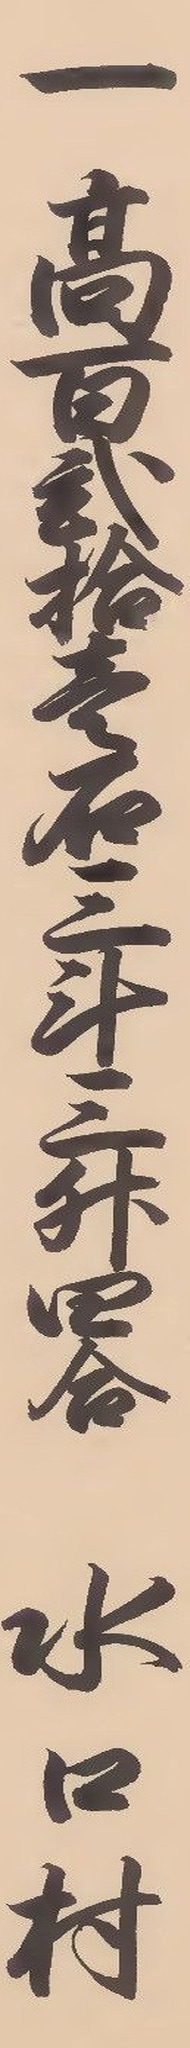一高百弐拾壱石三斗三升四合水口村
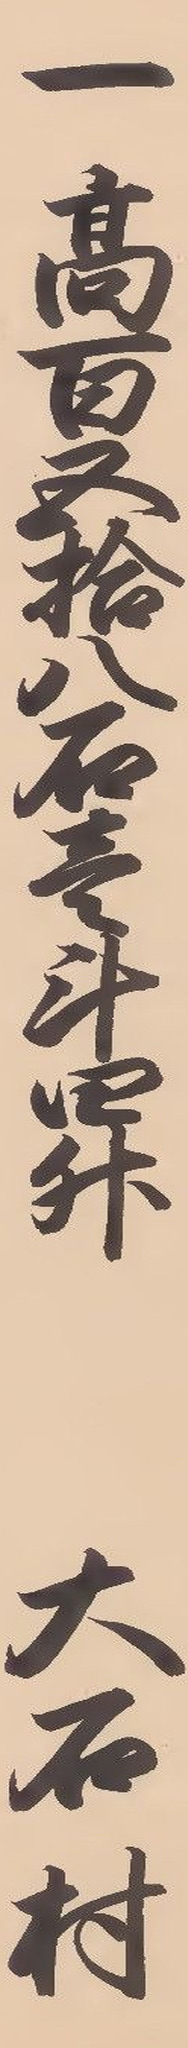一高百五拾八石壱斗四升大石村
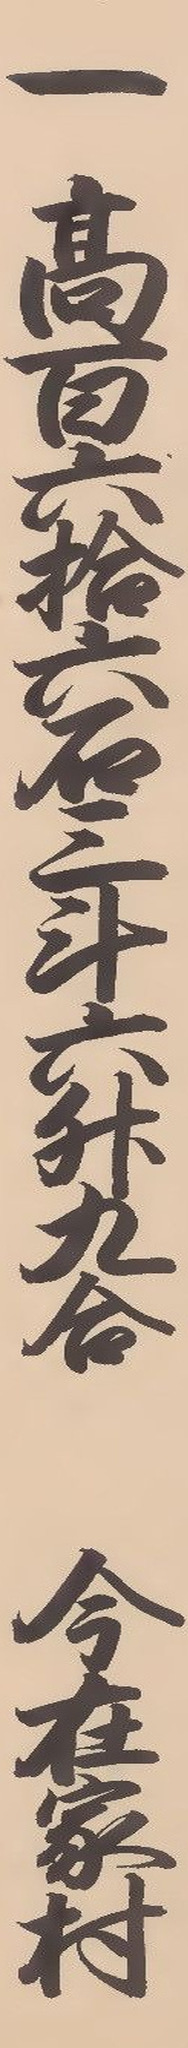一高百六拾六石三斗六升九合今在家村
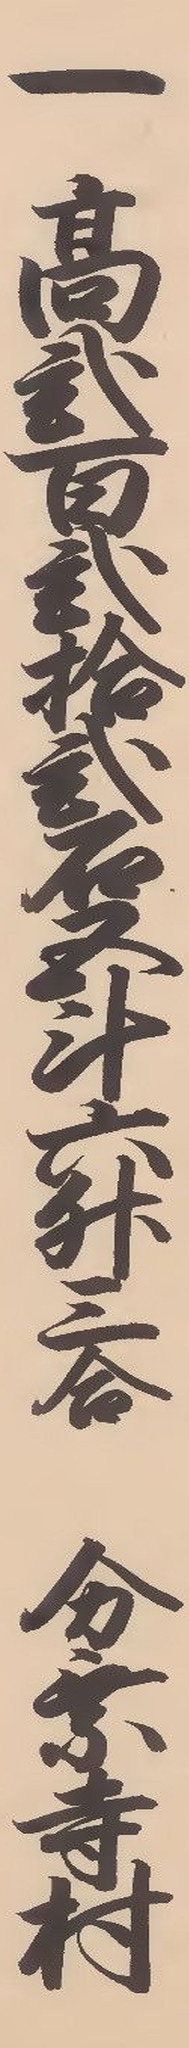一高弐百弐拾弐石五斗六升三合分乗寺村
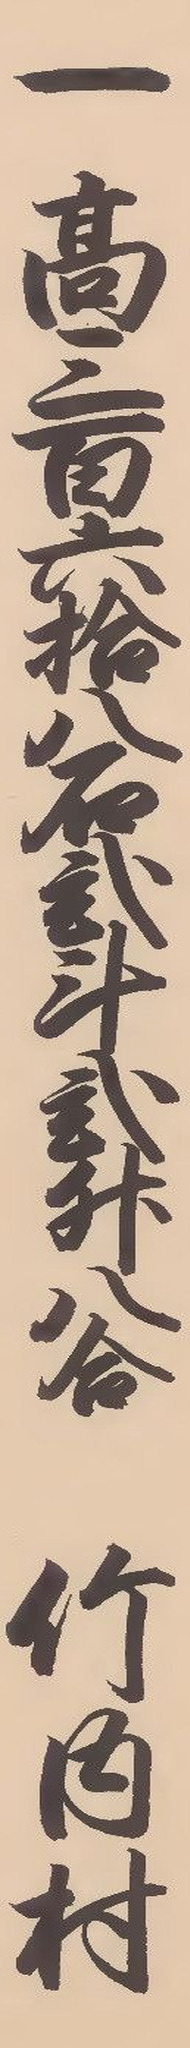一高三百六拾八石弐斗弐升八合竹内村
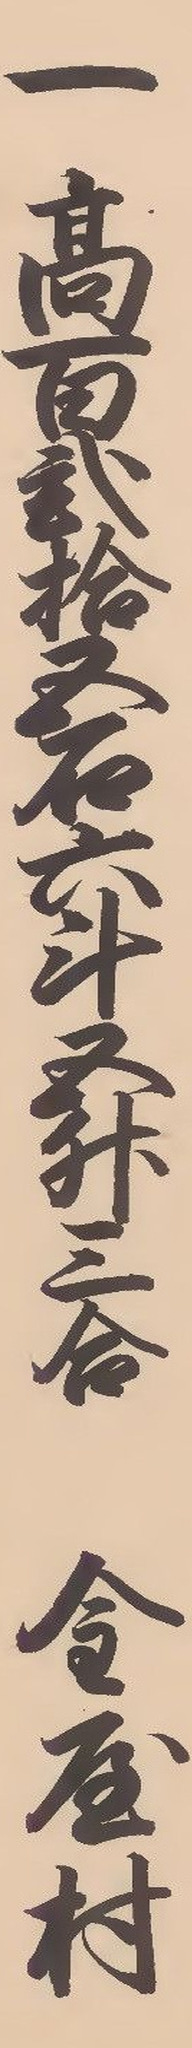一高百弐拾五石六斗五升三合金屋村

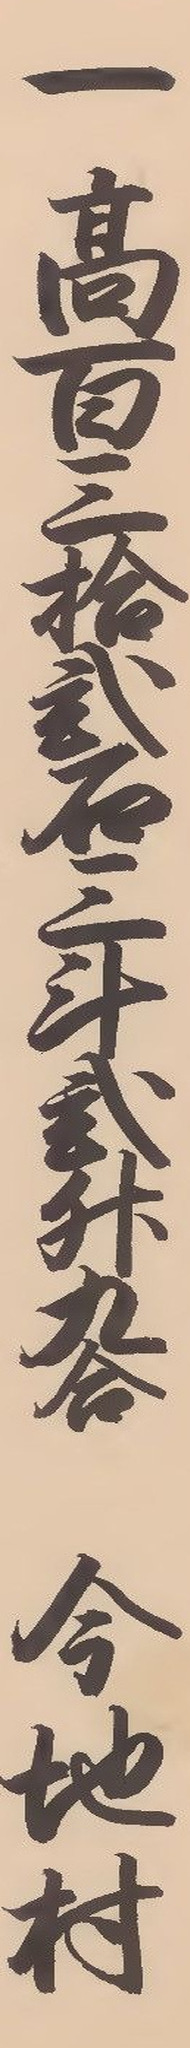一高百三拾弐石三斗弐升九合今地村
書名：伯耆国郷帳
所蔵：国立公文書館 National Archives of Japan
